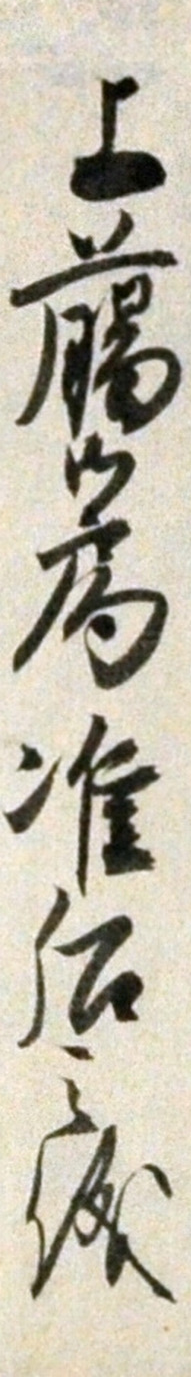上臈御局准后之儀
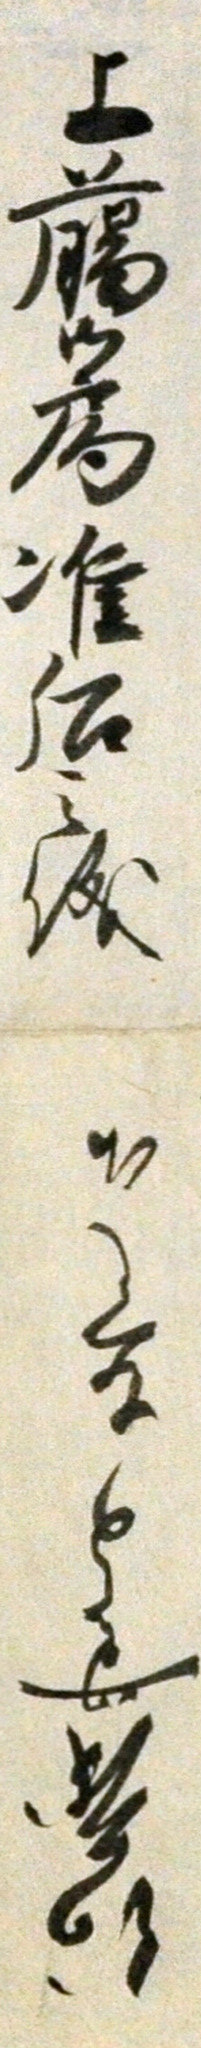上臈御局准后之儀
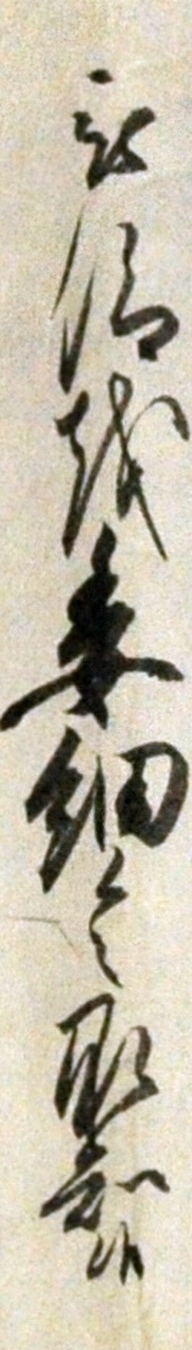被仰越委細令承知候
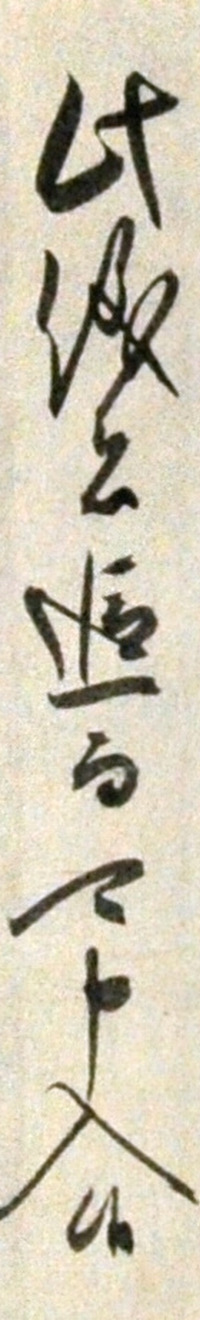此儀は追て可申入候
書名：書状
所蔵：伊那市立高遠町図書館・合同会社AMANE
